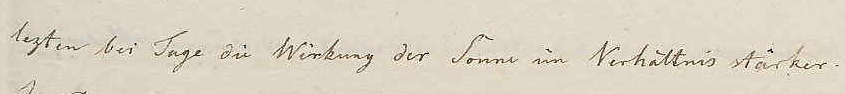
lezten bei Tage die Wirkung der Sonne im Verhältnis stärker.
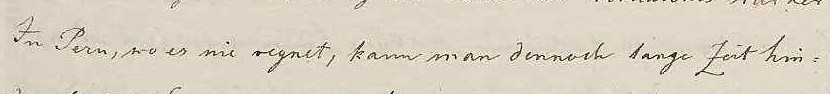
In Peru, wo es nie regnet, kann man dennoch lange Zeit hin-
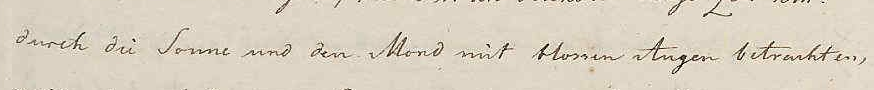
durch die Sonne und den Mond mit blossen Augen betrachten,
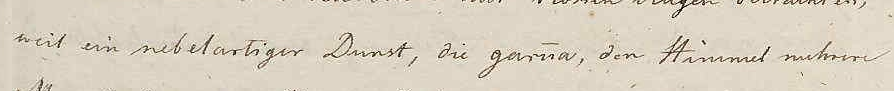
weil ein nebelartiger Dunst, die garūa, den Himmel mehrere
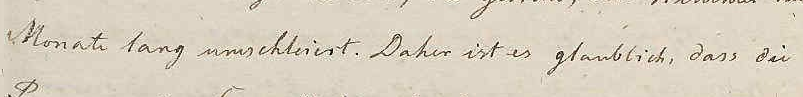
Monate lang umschleiert. Daher ist es glaublich, dass die
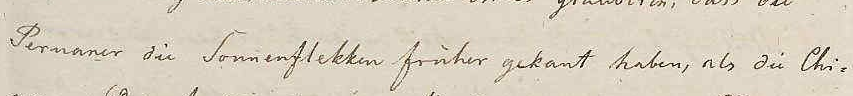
Peruaner die Sonnenflekken früher gekant haben, als die Chi-
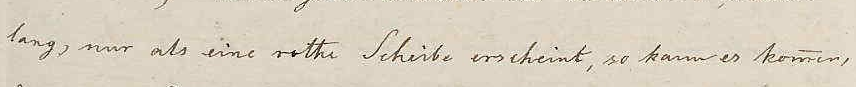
lang, nur als eine rothe Scheibe erscheint, so kann es kom̃en,
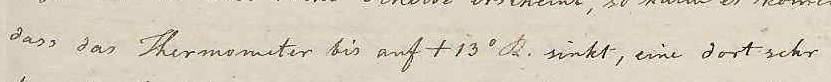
dass das Thermometer bis auf +13° R. sinkt, eine dort sehr
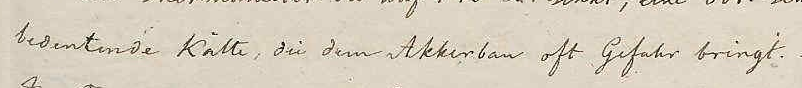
bedeutende Kälte, die dem Akkerbau oft Gefahr bringt. –
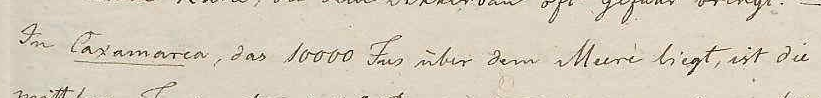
In Caxamarca, das 10000 Fus über dem Meere liegt, ist die
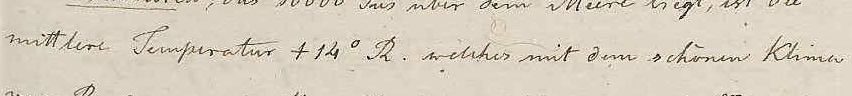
mittlere Temperatur +14° R. welches mit dem schönen Klima
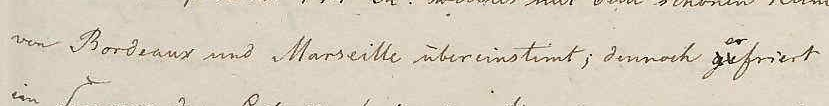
von Bordeaux und Marseille übereinstimt; dennoch geerfriert
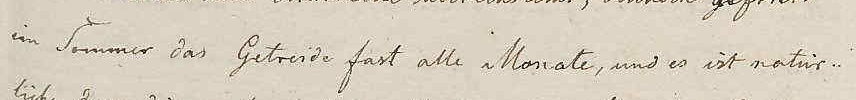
im Sommer das Getreide fast alle Monate, und es ist natür-
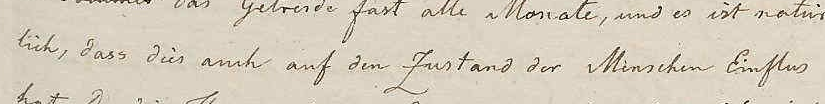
lich, dass dies auch auf den Zustand der Menschen Einflus
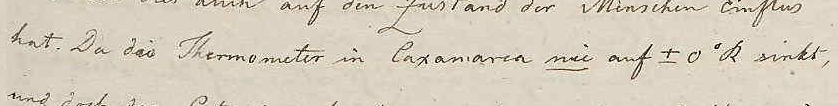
hat. Da dies Thermometer in Caxamarca nie auf ±0° R sinkt,
